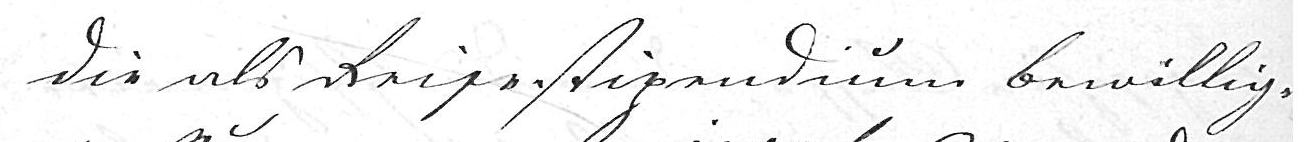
die als Reisestipendium bewillig-
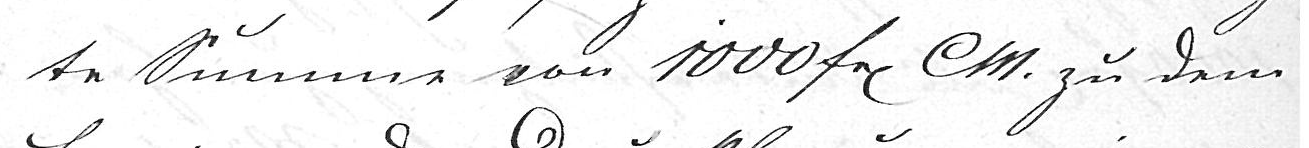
te Summe von 1000 fl CM. zu dem
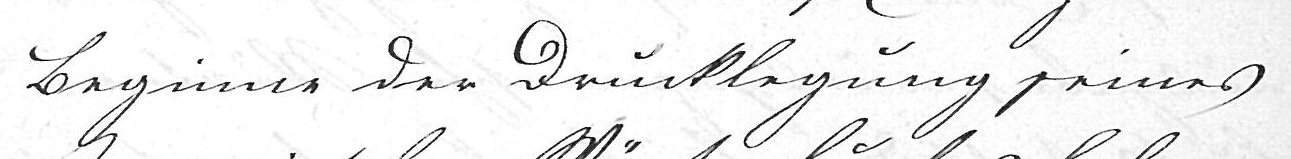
Beginne der Drucklegung seines
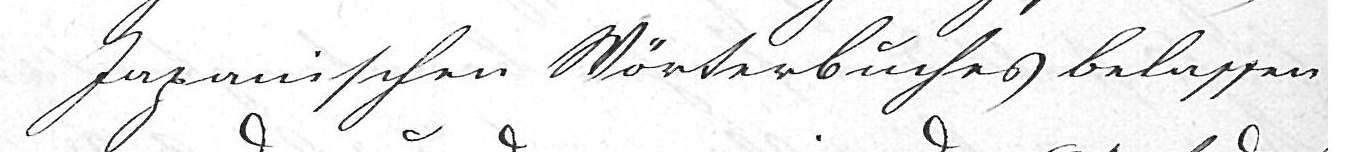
japanischen Wörterbuches belassen
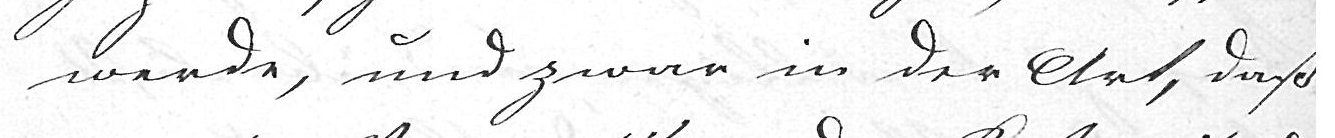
werde, und zwar in der Art, daß
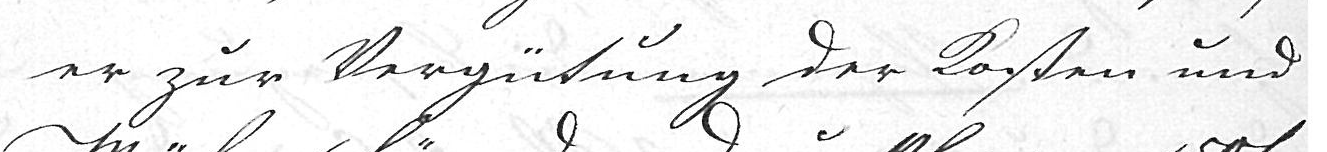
er zur Vergütung der Kosten und
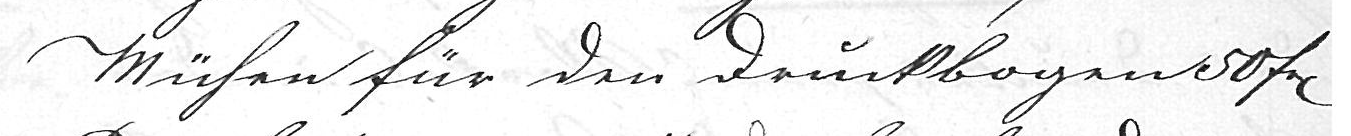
Mühen für den Druckbogen 50 fl
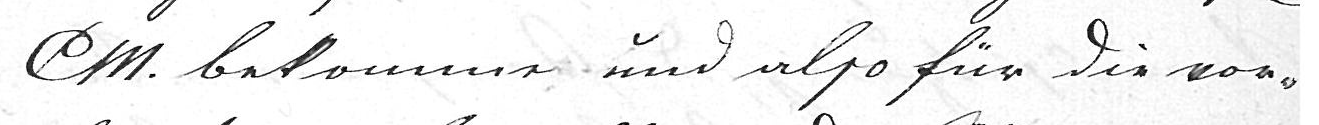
CM. bekomme und also für die vor-
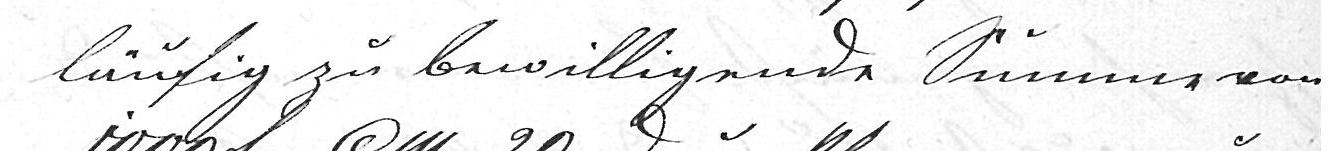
läufig in bewilligende Summe von
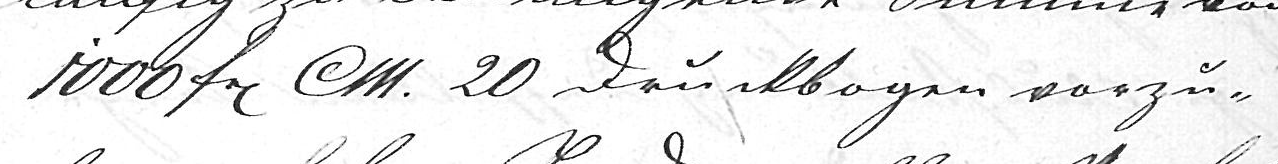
1000 fl CM. 20 Druckbogen vorzu-
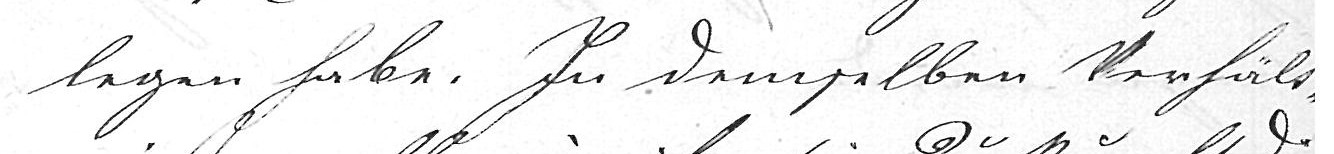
legen habe. In demselben Verhält-
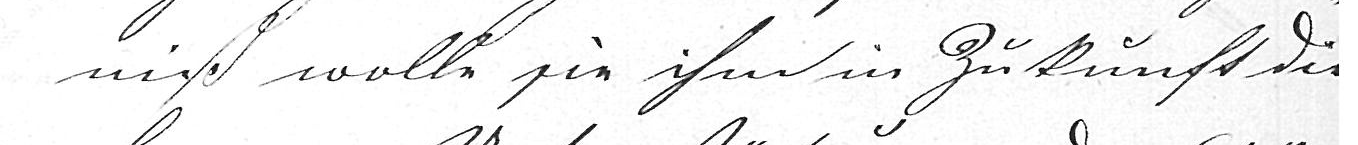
niß wolle sie ihn in Zukunft die
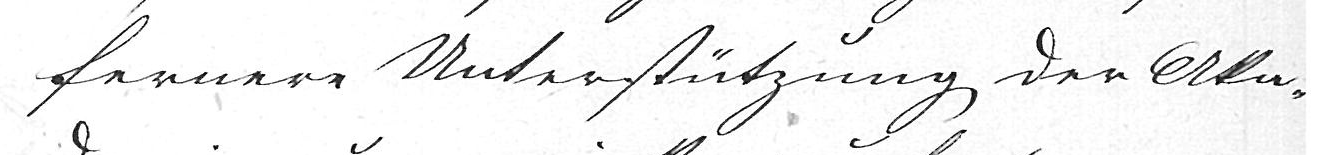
fernere Unterstützung der Aka-
